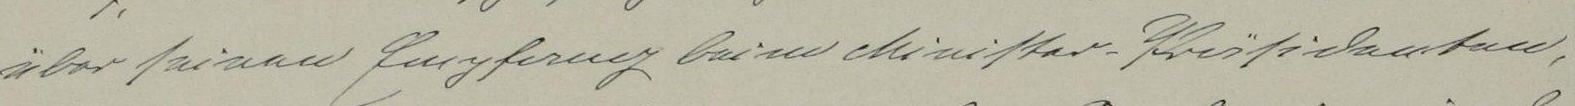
über seinen Empfang beim Minister-Präsidenten,
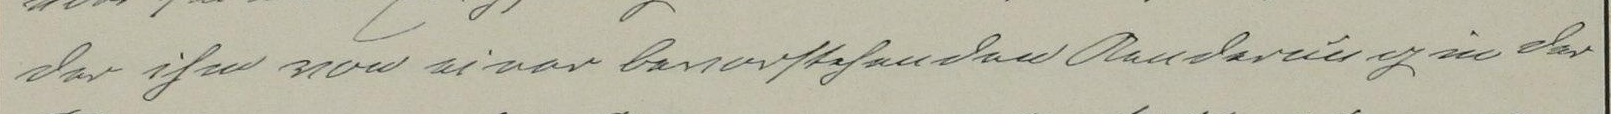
der ihm von einer bevorstehenden Aenderung in der
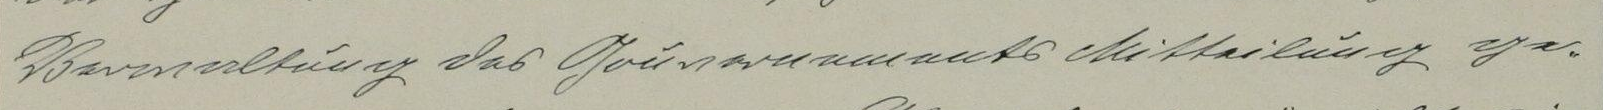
Verwaltung des Gouvernements Mitteilung ge-
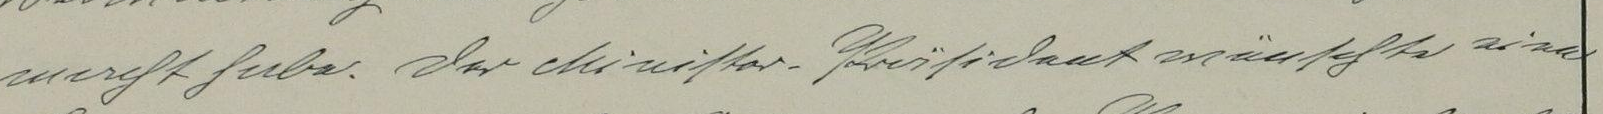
macht habe. Der Minister-Präsident wünschte eine
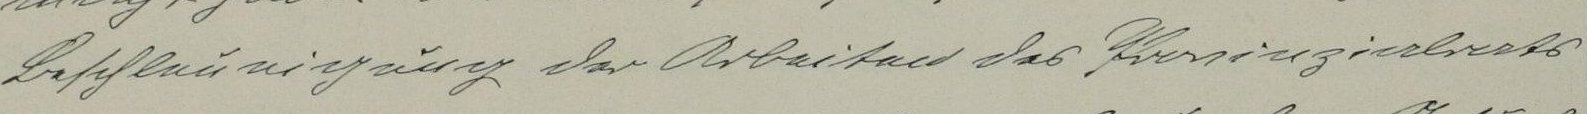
Beschleunigung der Arbeiten des Provinzialrats
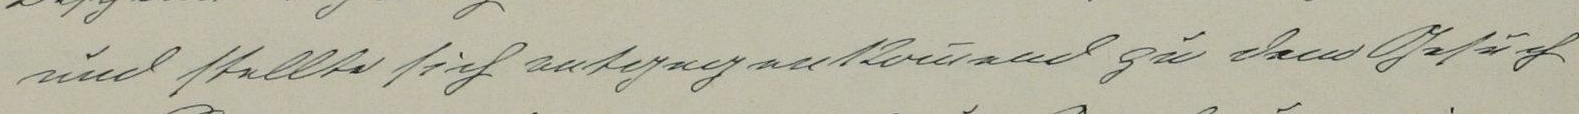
und stellte sich entgegenkommend zu dem Gesuch
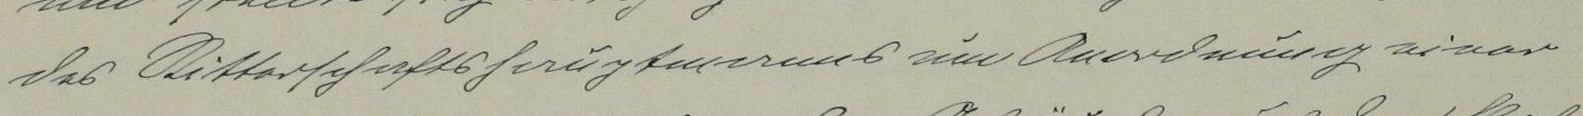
des Ritterschaftshauptmanns um Anordnung einer
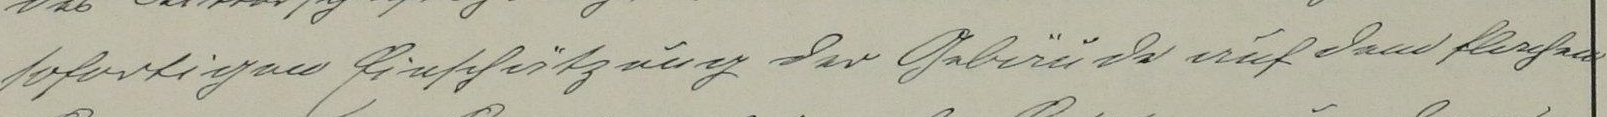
sofortigen Einschätzung der Gebäude auf dem flachen
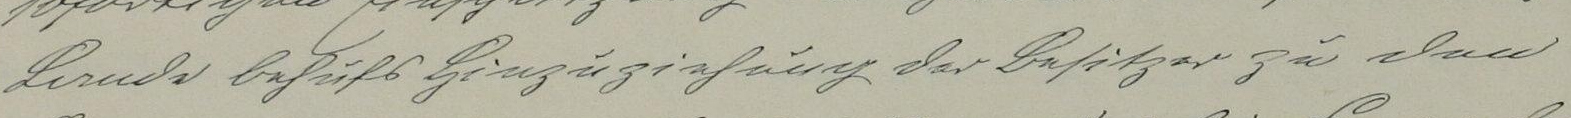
Lande behufs Hinzuziehung der Besitzer zu den
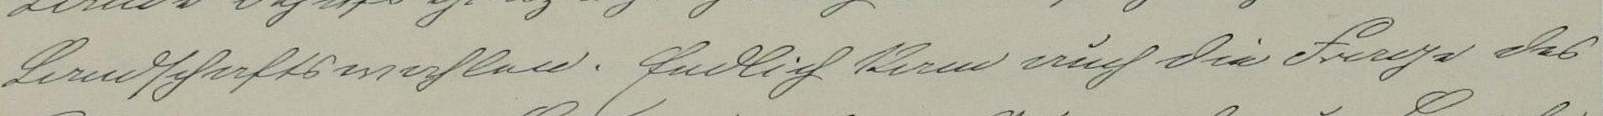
Landschaftswahlen. Endlich kam auch die Frage des
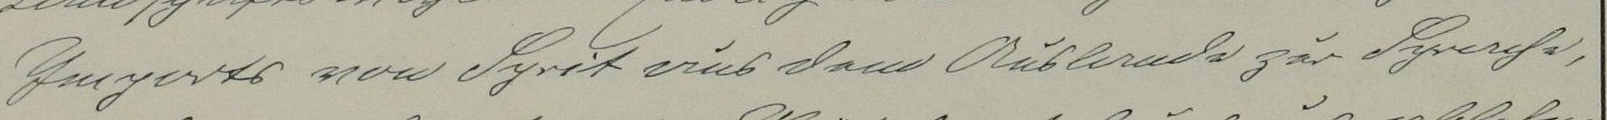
Imports von Sprit aus dem Auslande zur Sprache,
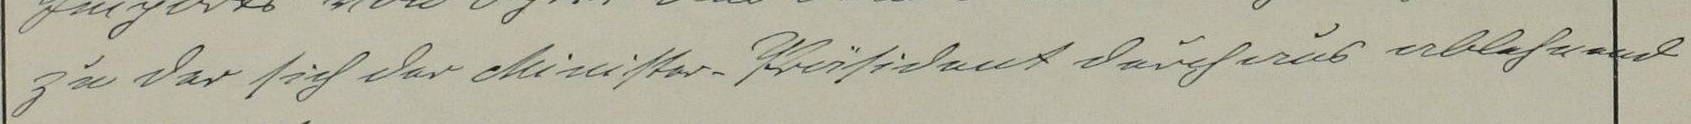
zu der sich der Minister-Präsident durchaus ablehnend
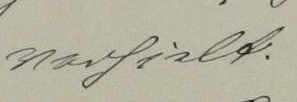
verhielt.
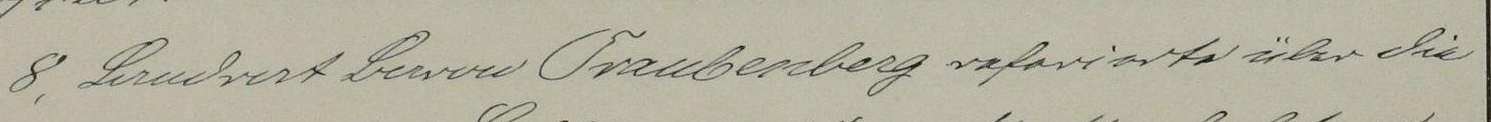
8. Landrat Baron Traubenberg referierte über die
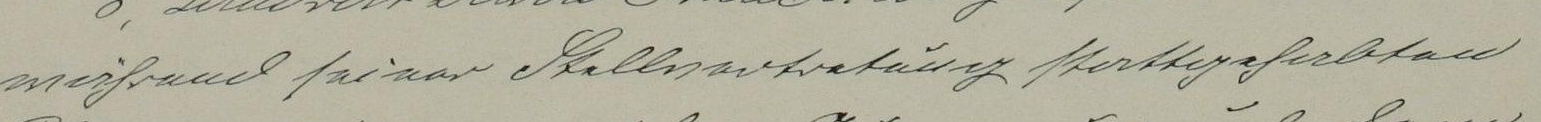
während seiner Stellvertretung stattgehabten
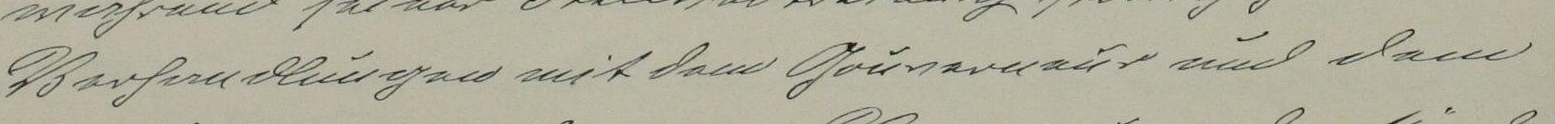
Verhandlungen mit dem Gouverneur und dem
